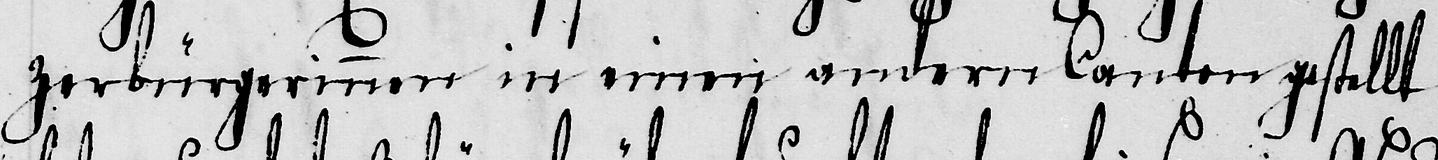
zerbürgerinnen in einen andern Canton gestellt
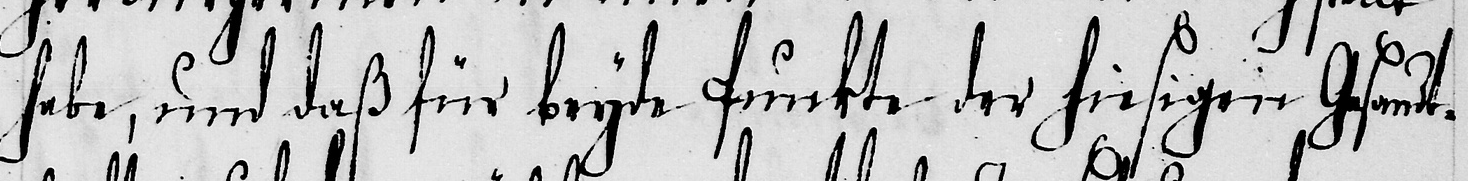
habe, und daß für beyde Punkte der hiesigen Gesan¬
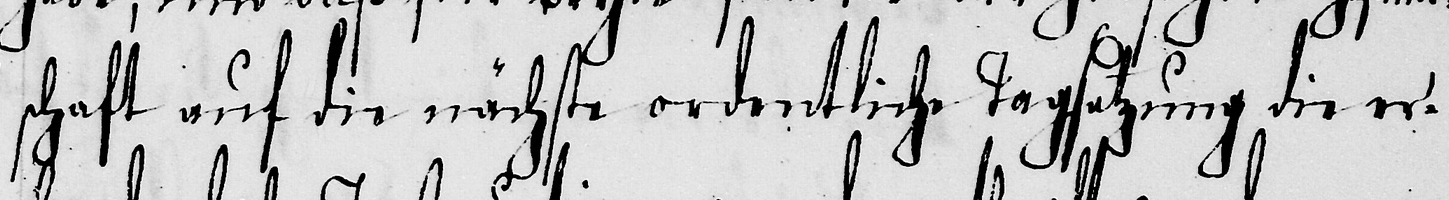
schaft auf die nächste ordentliche Tagsatzung die e¬
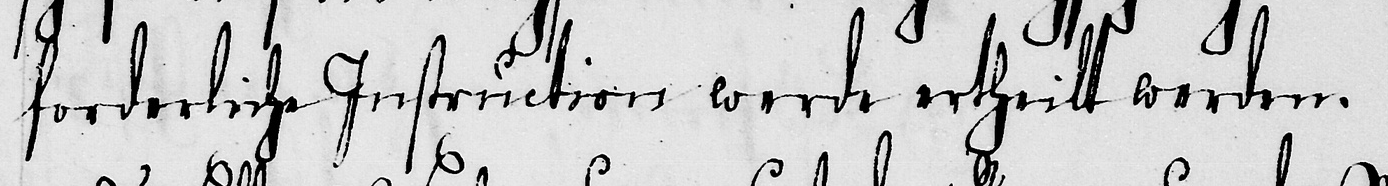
rforderliche Instruction werde ertheilt werden.
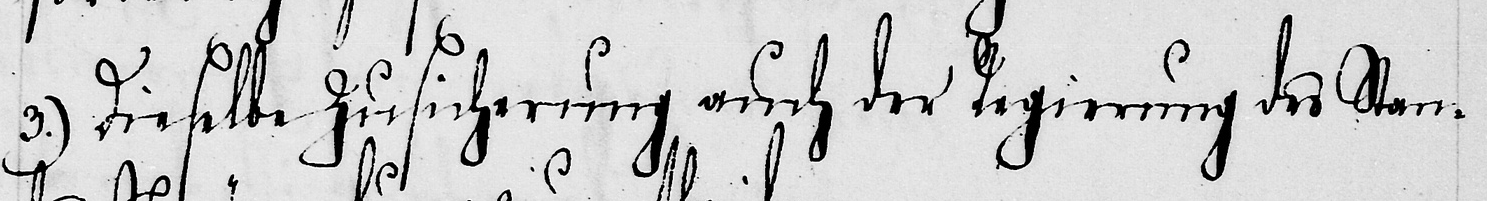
3.) Dieselbe Zusicherung auch der Regierung des Stan¬
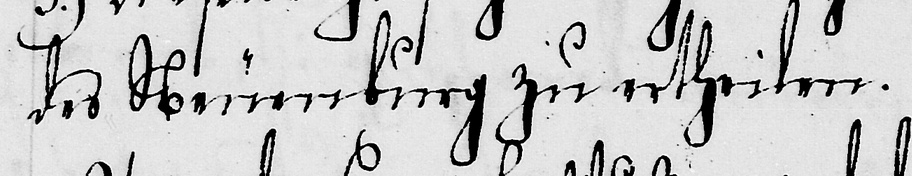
des Neuenburg zu ertheilen.
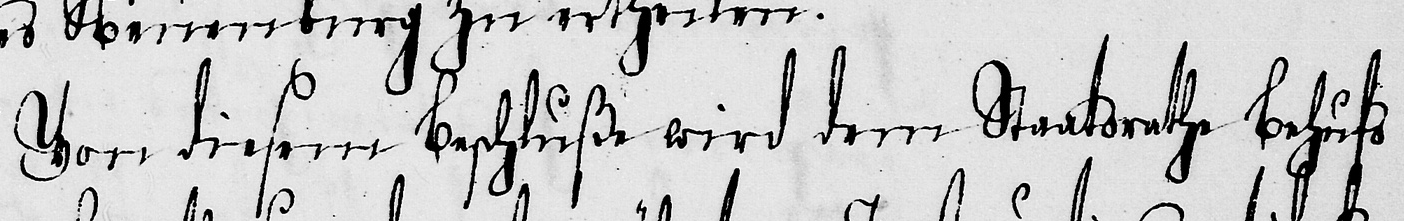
Von diesem Beschluße wird dem Staatsrathe Behufs
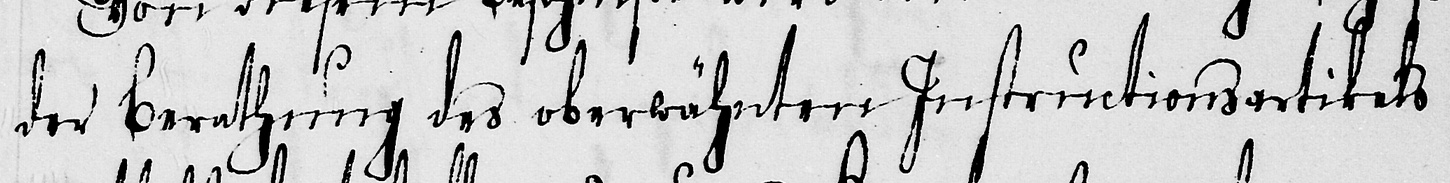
der Berathung des oberwähnten Instructionsartikels
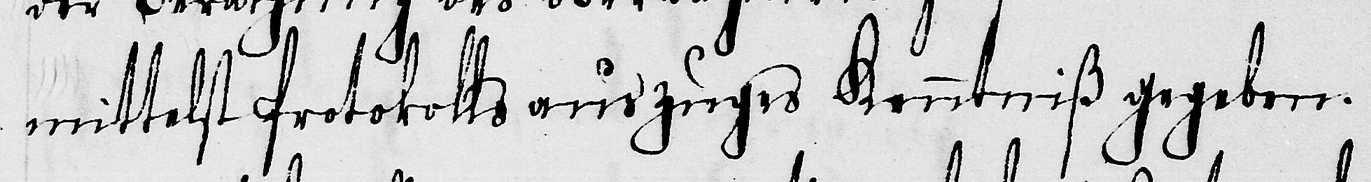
mittelst Protokollsauszuges Kenntniß gegeben.
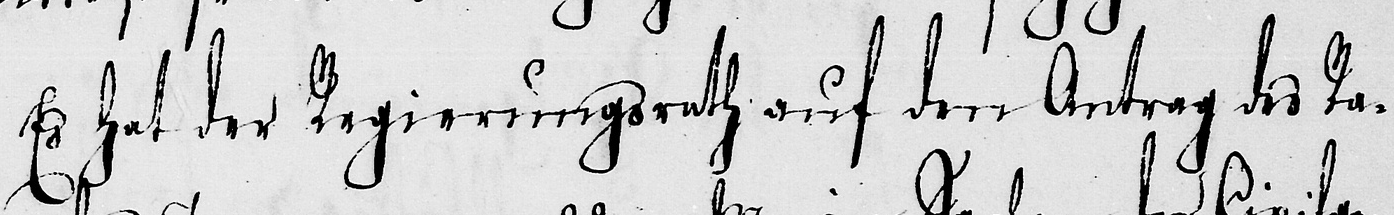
Es hat der Regierungsrath auf den Antrag des Ra¬
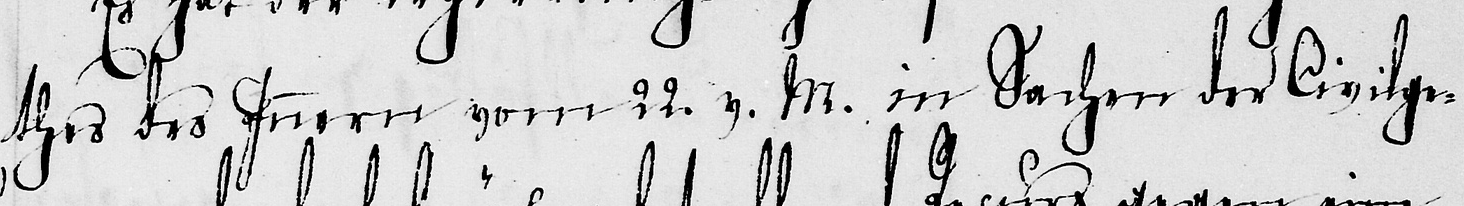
thes des Innern vom 22. v. M. in Sachen der Civilge¬
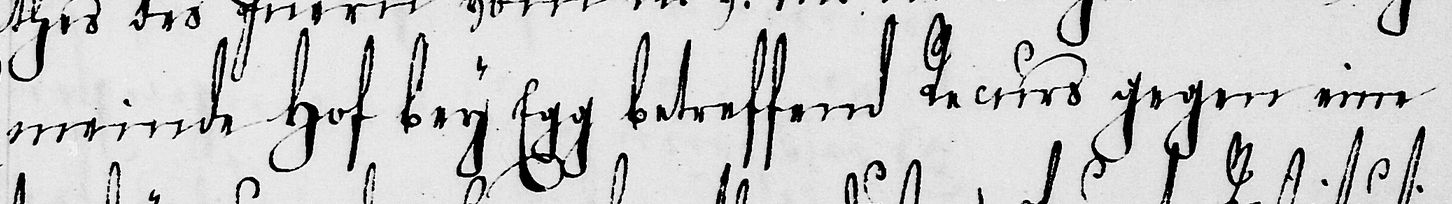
meinde Hof bey Egg betreffend Recurs gegen eine
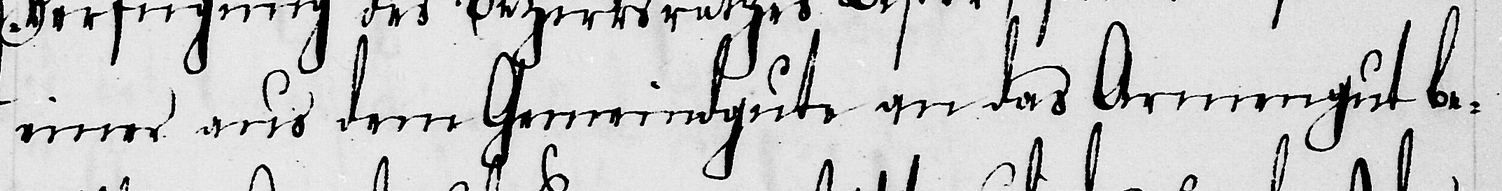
einer aus dem Gemeindgute an das Armengut be¬
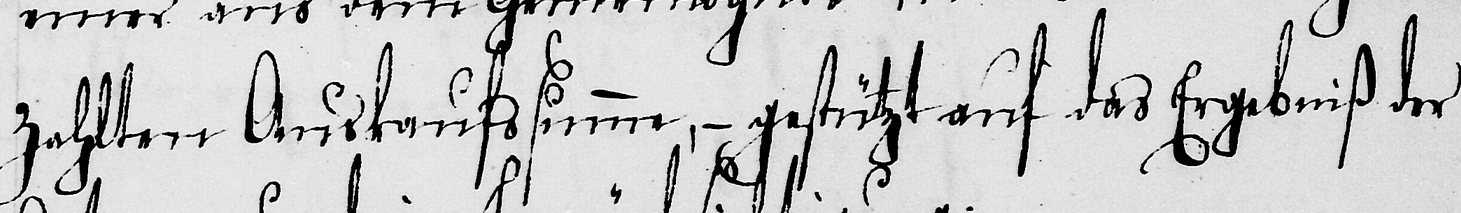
zahlten Auskaufssumme, – gestützt auf das Ergebniß der
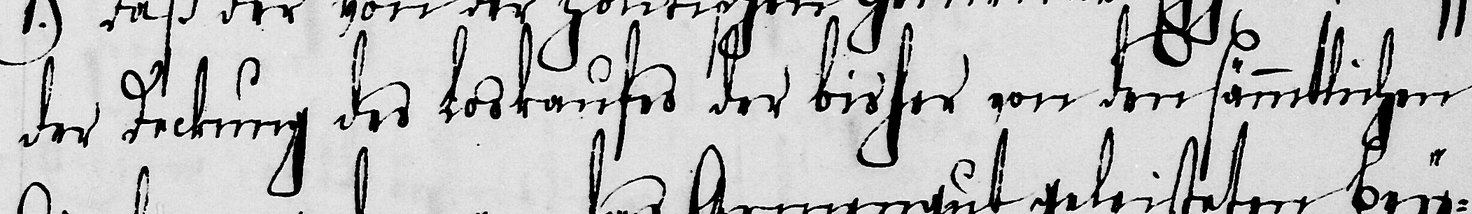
der Deckung des Loskaufes der bisher von den sämmtlichen
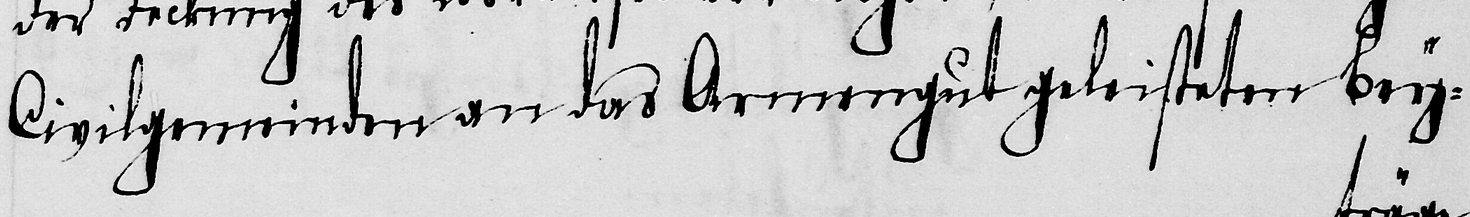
Civilgemeinden an das Armengut geleisteten Bey-
